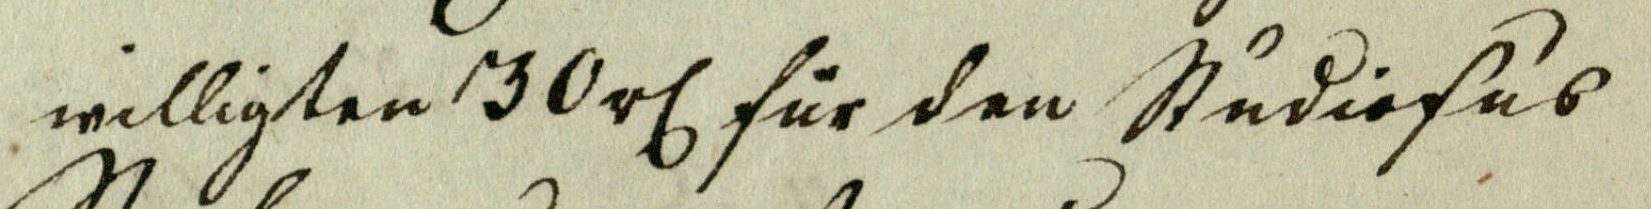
willigten 30 r für den Studiosus
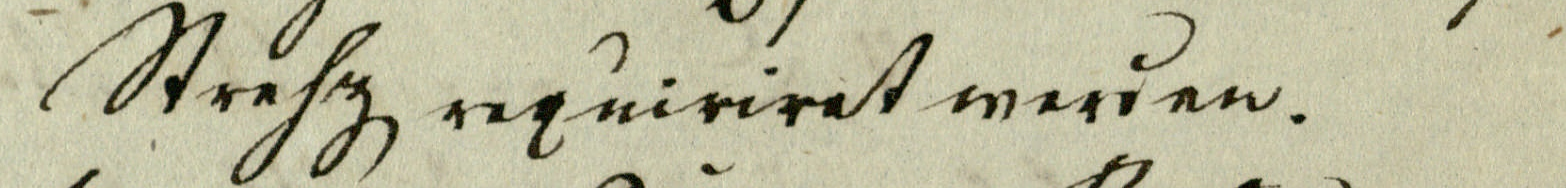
Strehz requiriret werden.
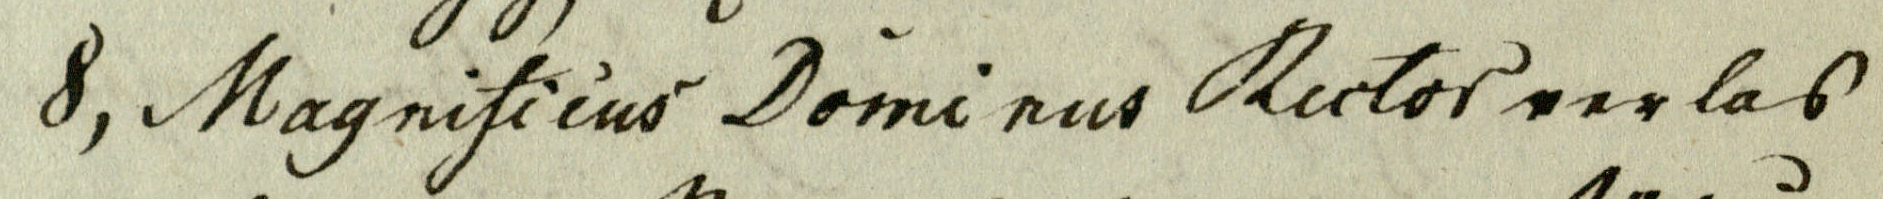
8, Magnificus Dominus Rector verlas
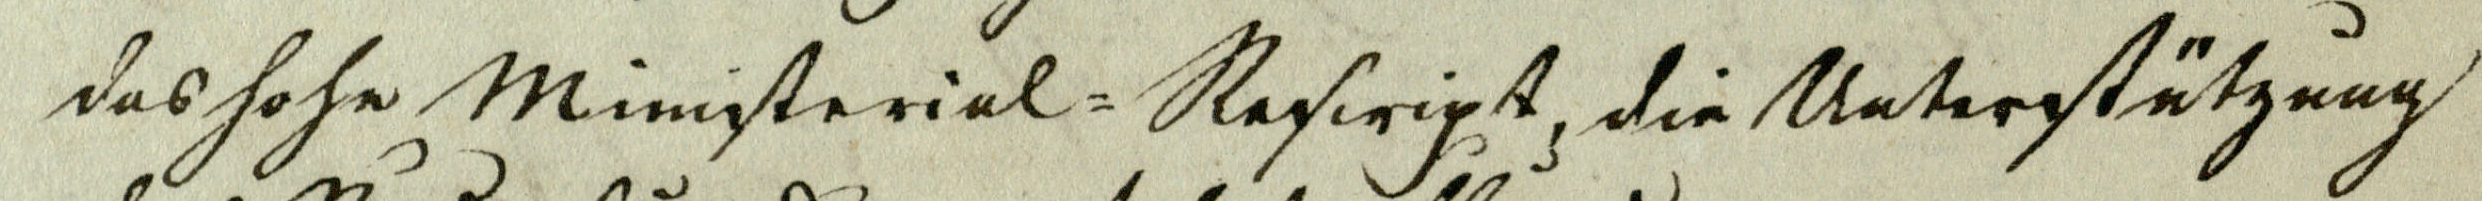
das hohe Ministerial-Rescript, die Unterstützung
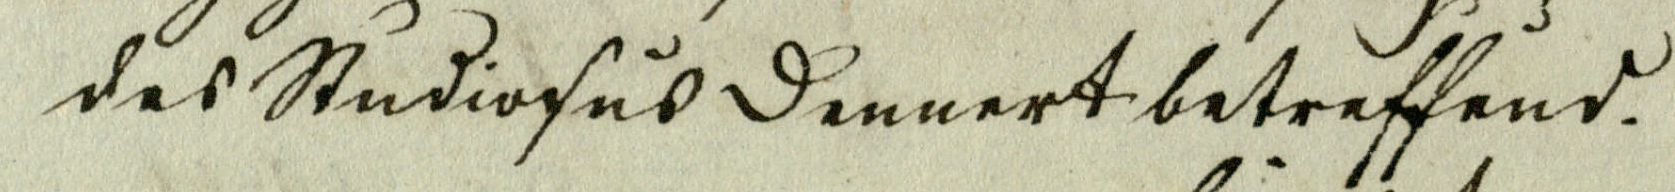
des Studiosus Dennert betreffend.
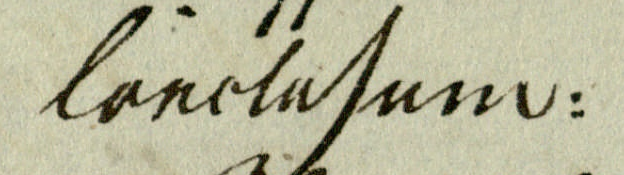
Conclusum:
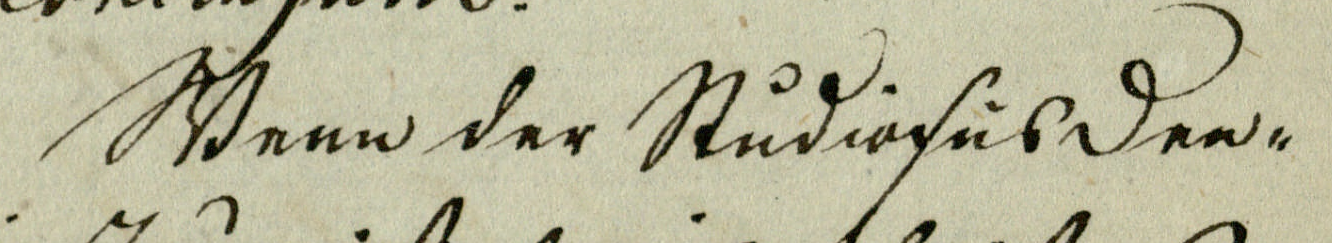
Wenn der Studiosus Den¬
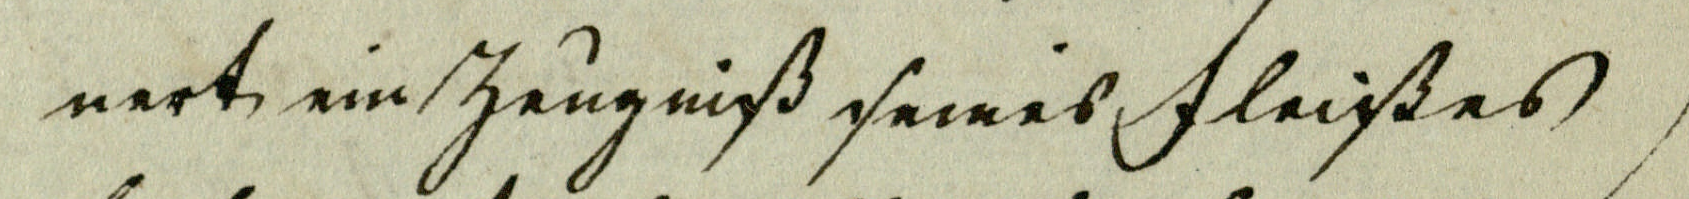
nert ein Zeugniß seines Fleißes
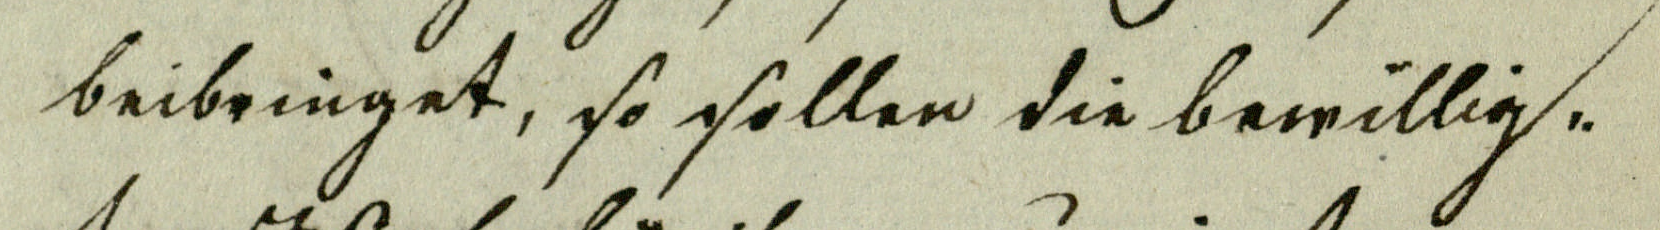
beibringet, so sollen die bewillig¬
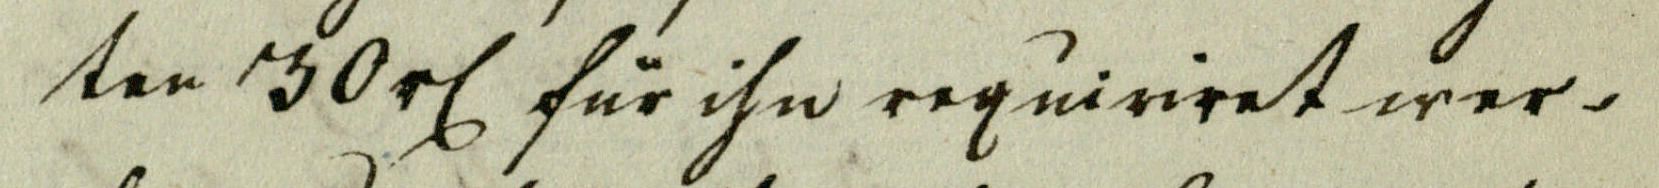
ten 30 r für ihn requiriret wer¬
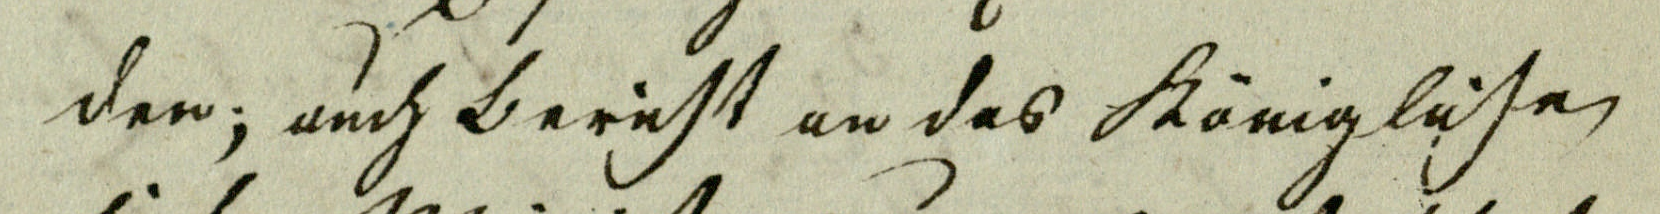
den; auch Bericht an das Königliche
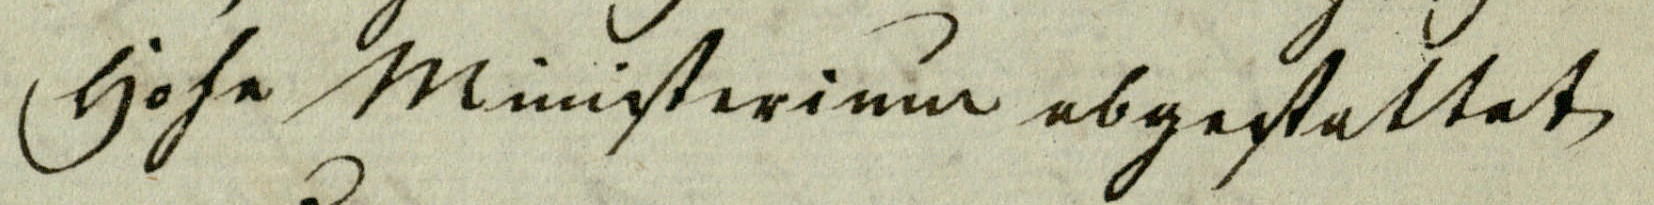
Hohe Ministerium abgestattet
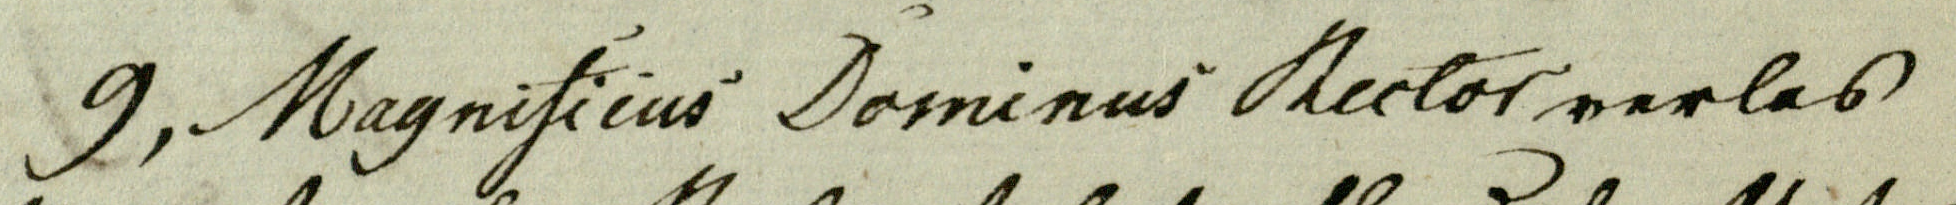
9, Magnificus Dominus Rector verlas
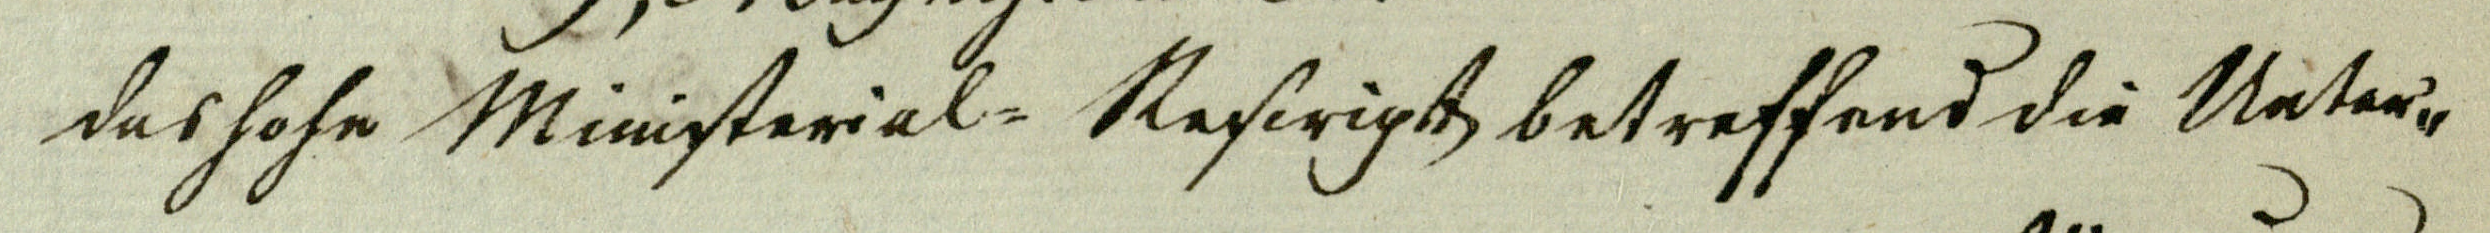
das hohe Ministerial-Rescript betreffend die Unter¬
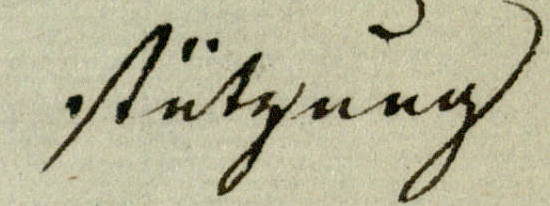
stützung
